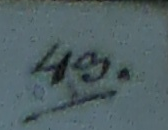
43.
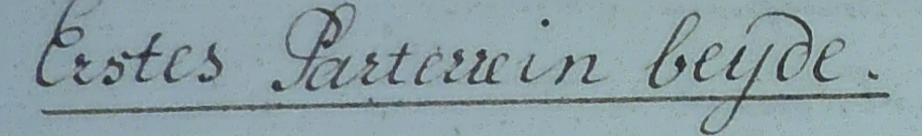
Erstes Parterre in beyde.
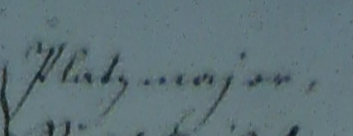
Platzmajor,
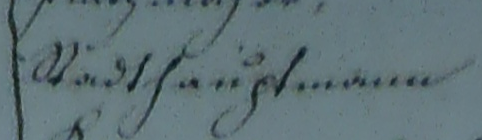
Stadthauptmann
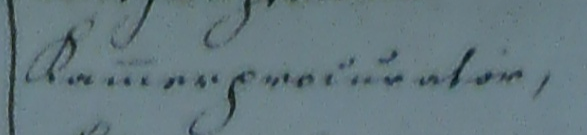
Kam̅erprocurator,
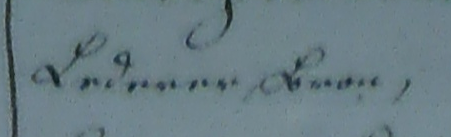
Lederer Aron,
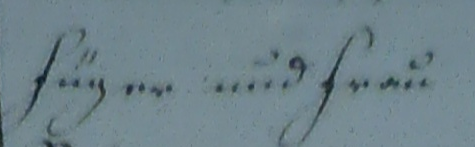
Füger und Frau
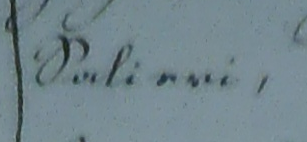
Salieri,
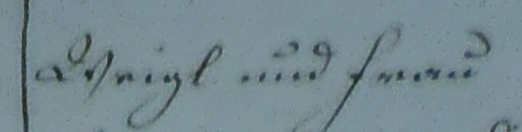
Weigl und Frau
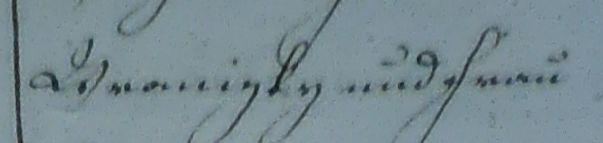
Wranizky und Frau
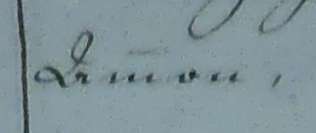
Amon,
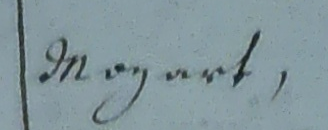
Mozart,
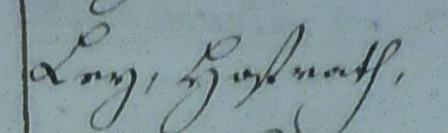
Ley, Hofrath,
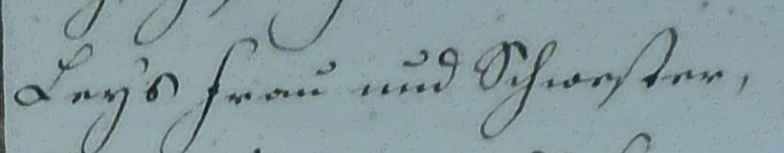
Ley‘s Frau und Schwester,
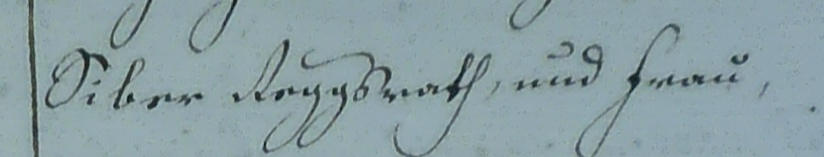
Siber Reg͞gsrath, und Frau,
